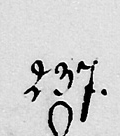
2.) S¬
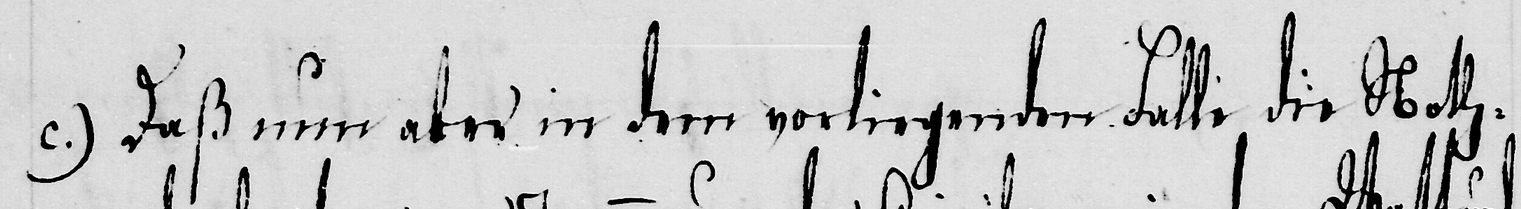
c.) Daß nun aber in dem vorliegenden Falle die Noth¬
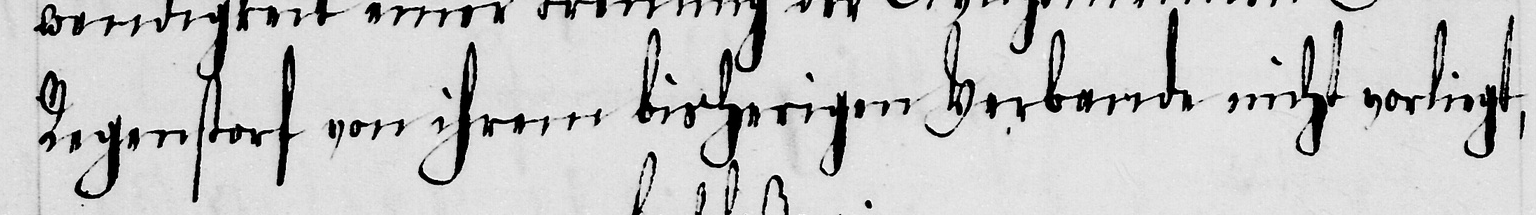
Regenstorf von ihrem bisherigen Verbande nicht vorlie¬
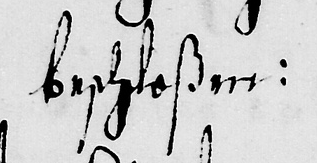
beschloßen:
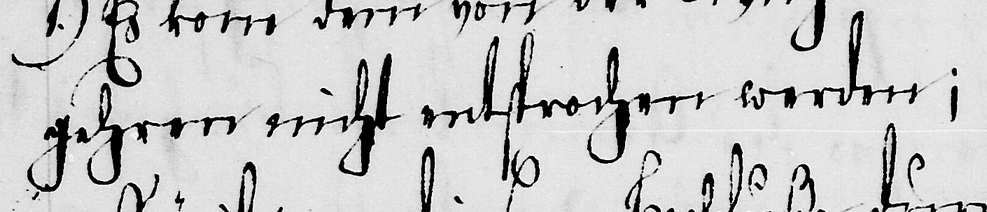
gehren nicht entsprochen werden;
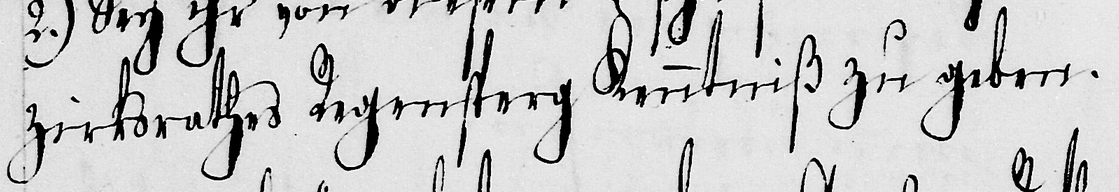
zirksrathes Regensperg Kenntniß zu geben.
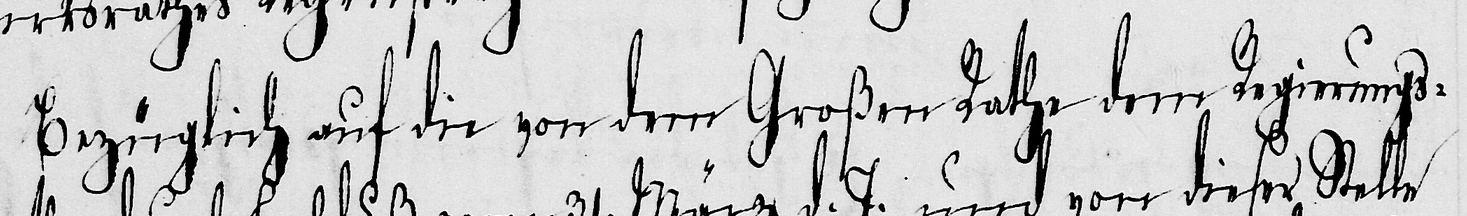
Bezüglich auf die von dem Großen Rathe dem Regierung¬
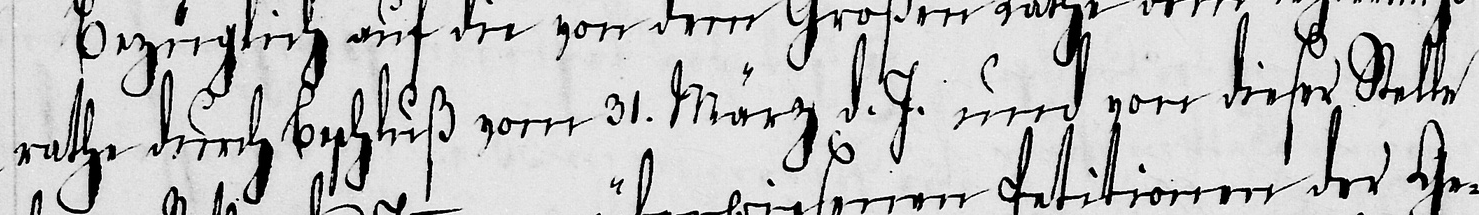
srathe durch Beschluß vom 31. März d. J. und von dieser Stelle
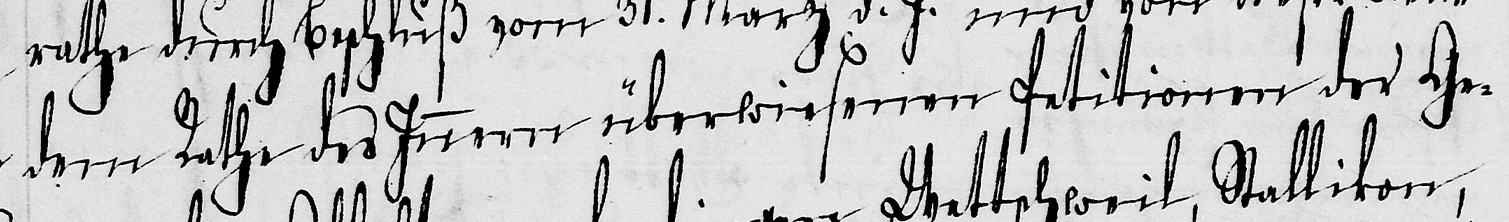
dem Rathe des Innern überwiesenen Petitionen der Ge¬
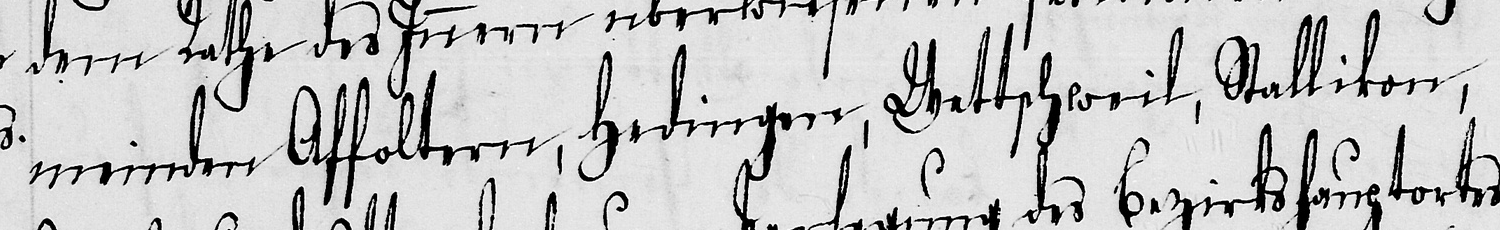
meinden Affoltern, Hedingen, Wettschweil, Stallikon,
